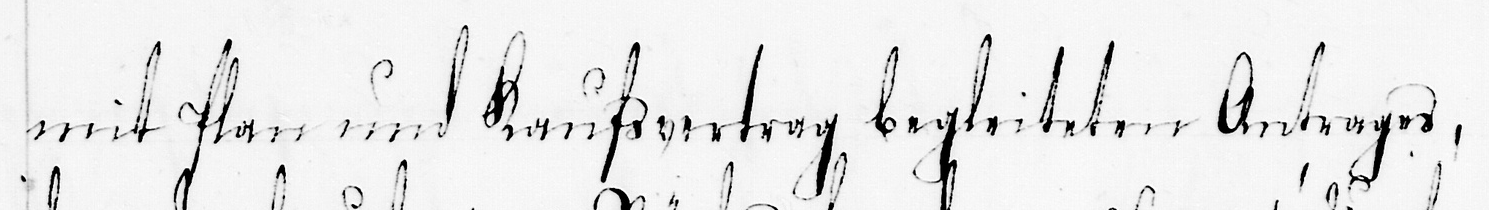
mit Plan und Kaufsvertrag begleiteten Antrages,
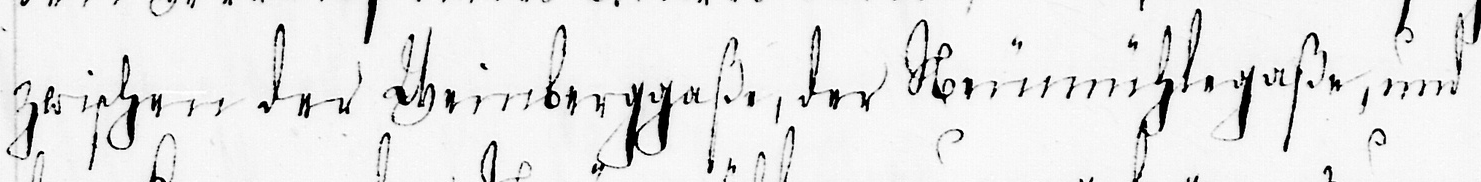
zwischen der Weinberggaße, der Neumühlegaße, und
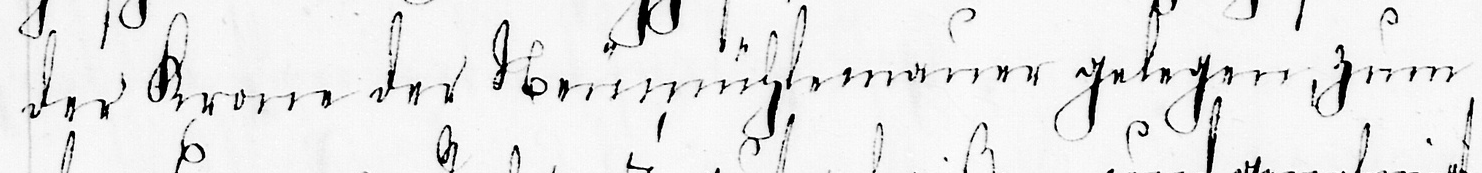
der Krone der Neumühlemauer gelegen, zum
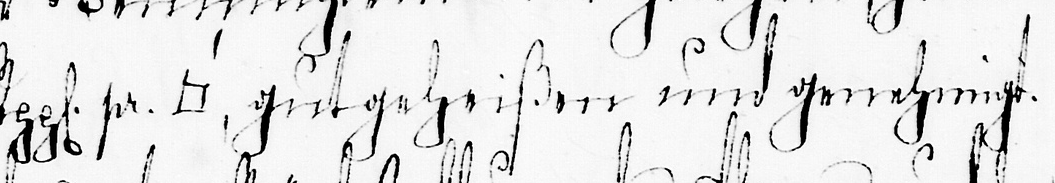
dratfuss], gutgeheißen und genehmigt.
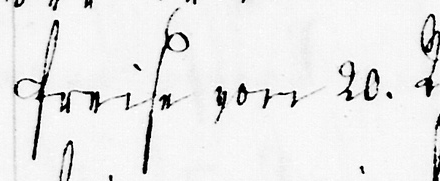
Preise von 20.
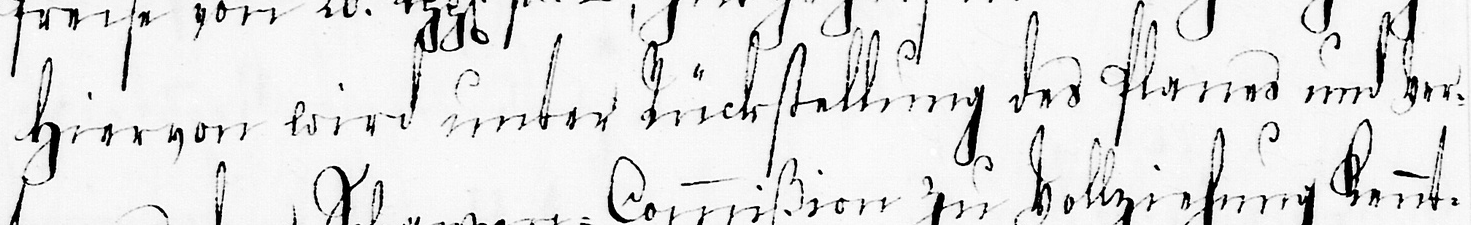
Hiervon wird unter Rückstellung des Planes und Ver¬
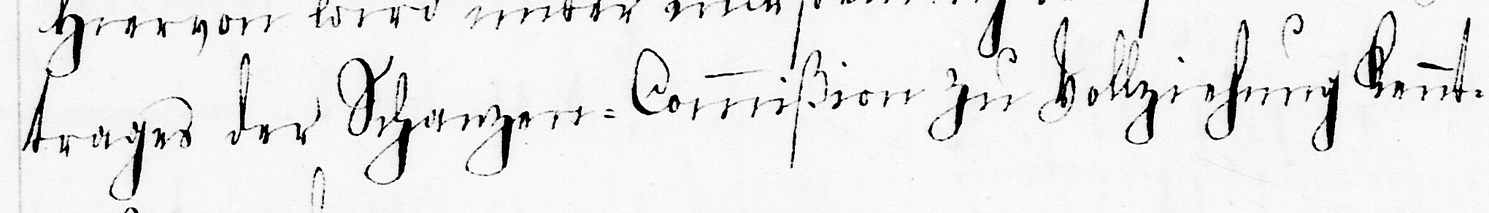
trages der Schanzen-Commißion zu Vollziehung Kennt¬
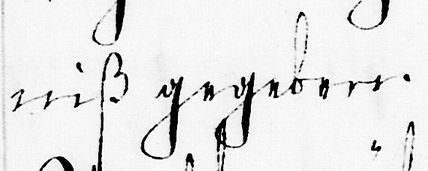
niß gegeben.
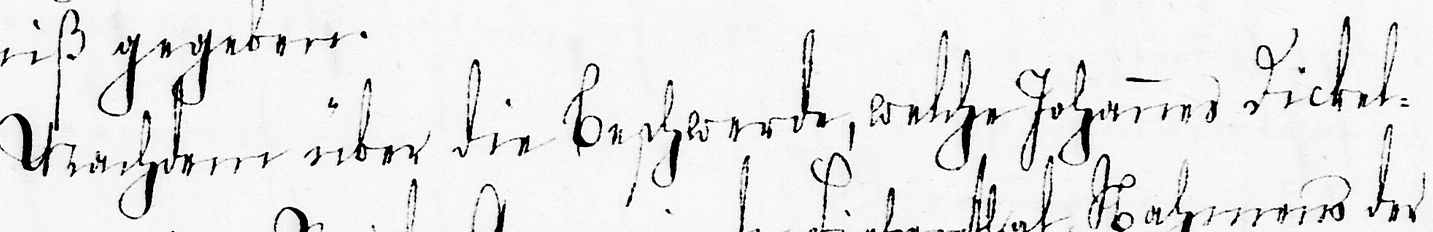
Nachdem über die Beschwerde, welche Johannes Dickel¬
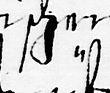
der
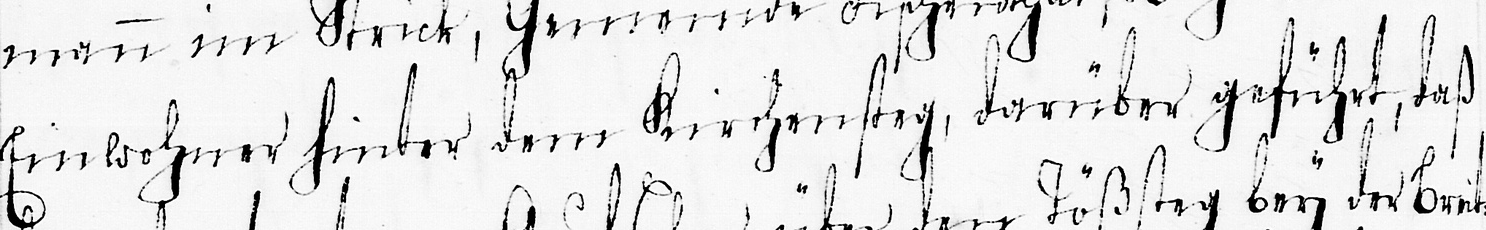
Einwohner hinter dem Kirchensteg, darüber geführt, daß
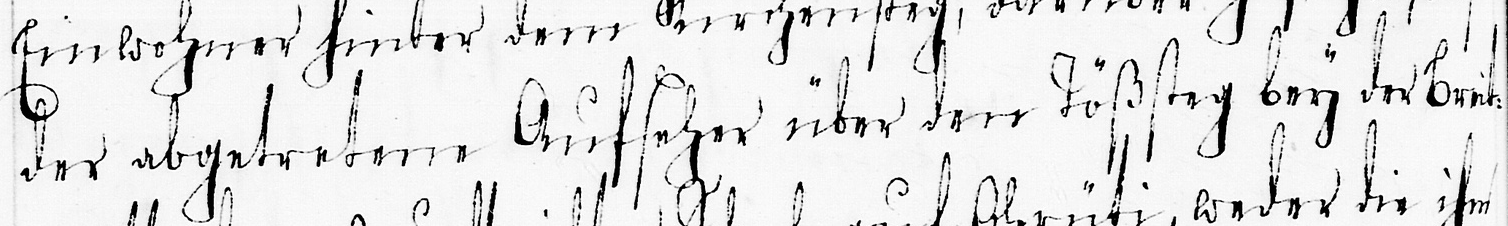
der abgetretene Aufseher über den Tößsteg bey der Brei¬
